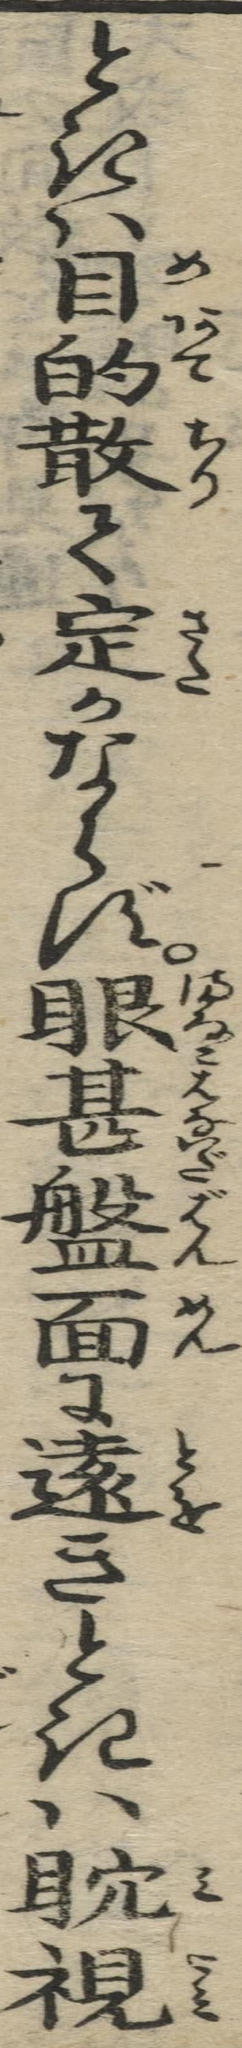ときは目的散て定かならず。眼甚盤面に遠きときは耽視
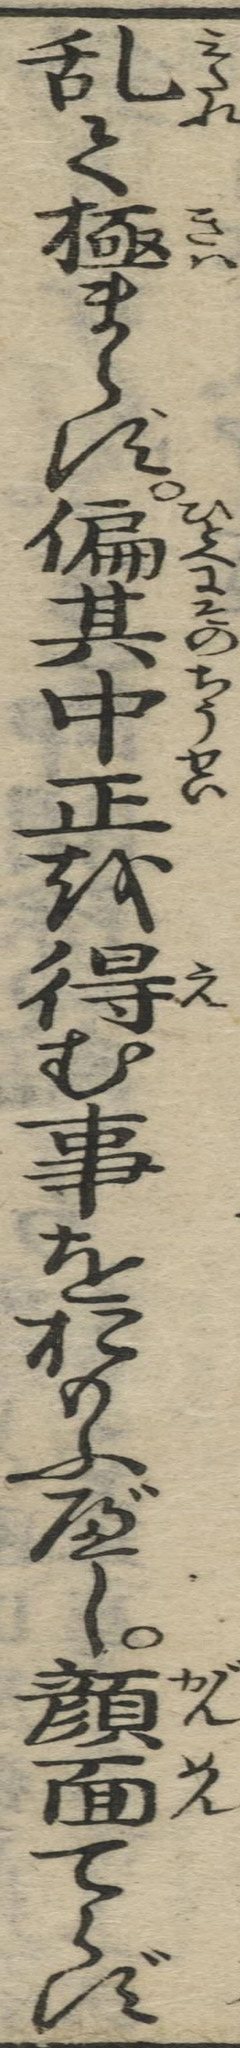乱て極まらず。偏其中正を得む事をおもふべし。顔面てらず
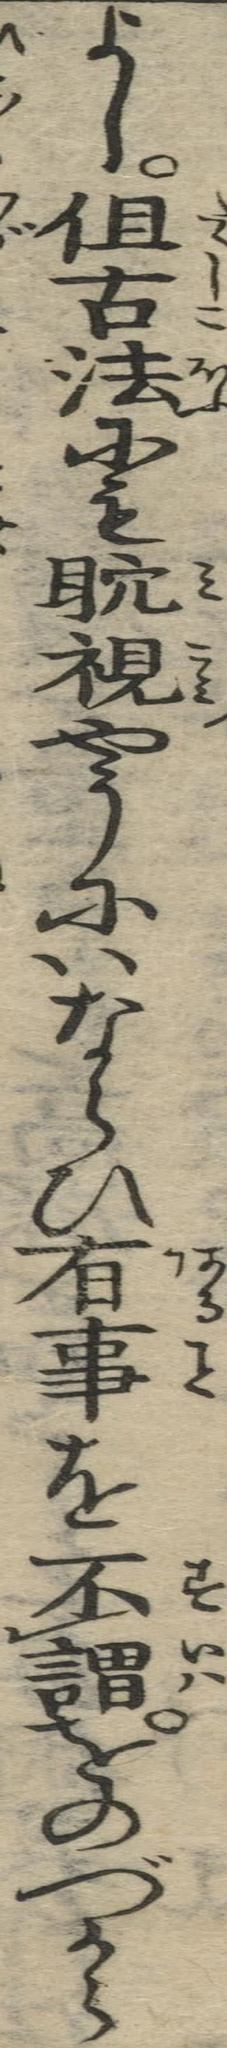よし。但古法にも耽視やうにはならひ有事を不謂。をのづから
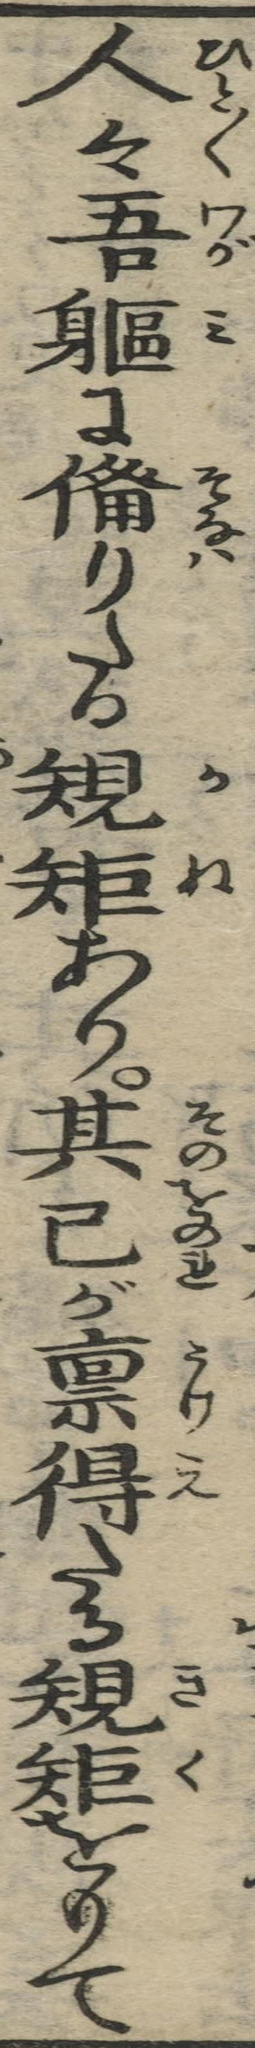人々吾身に備りたる規矩あり。其己が稟得たる規矩をもて
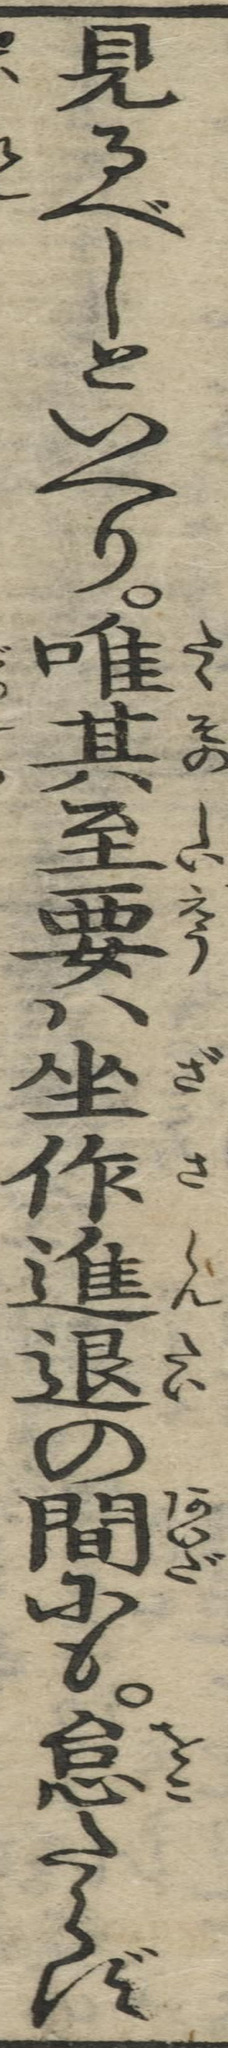見るべしといへり。唯其至要は坐作進退の間にも。怠たらず
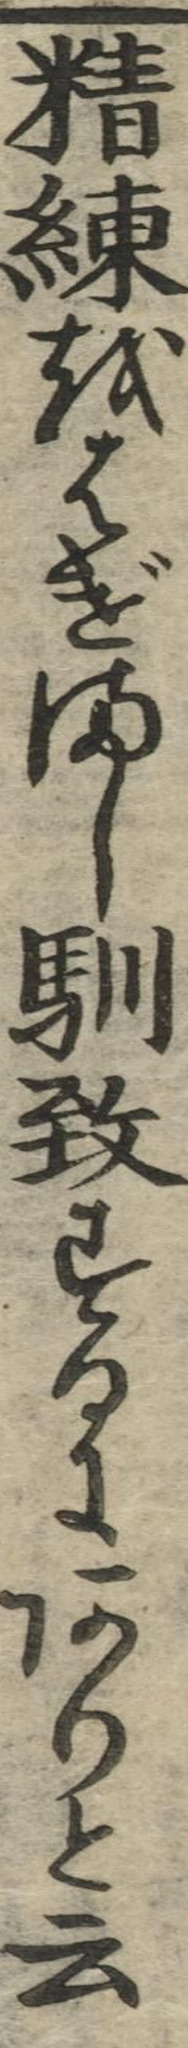精練をはげまし馴致するにありと云
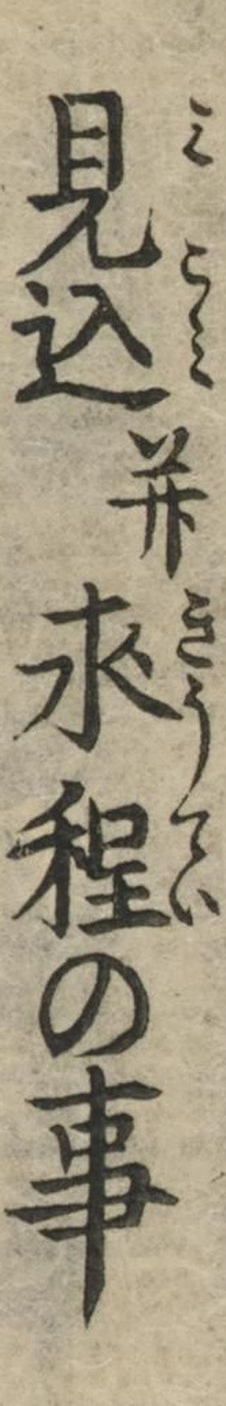見込并来程の事

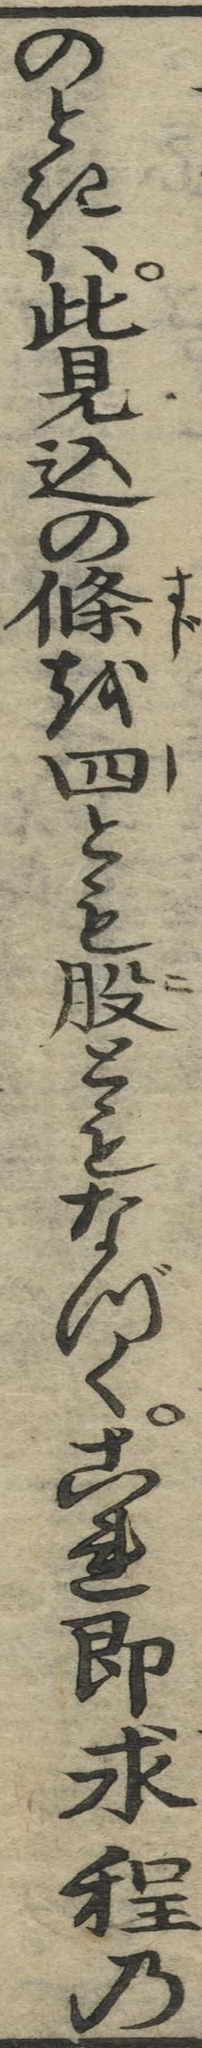のときは。此見込の条を四とも股ともなづく。これ即求程の
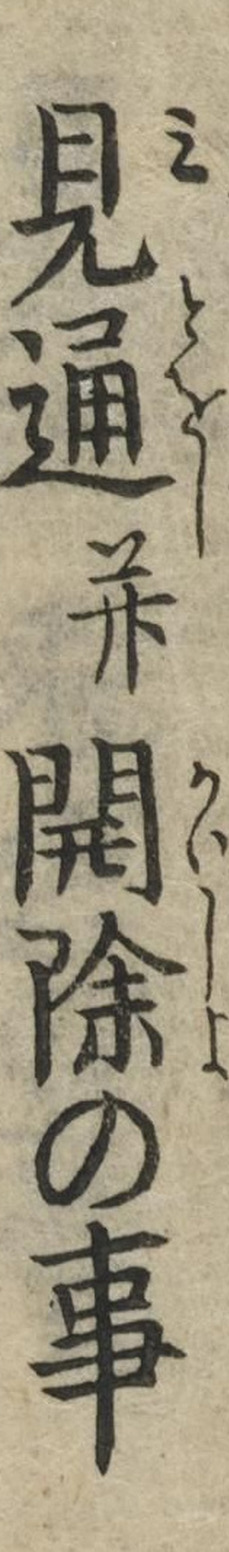見通并開除の事
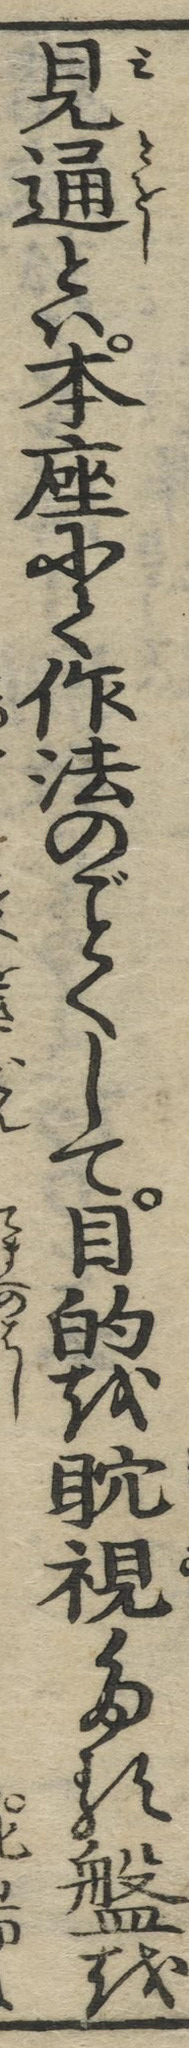見通とは。本座にて作法のごとくして。目的を睨視たる盤を
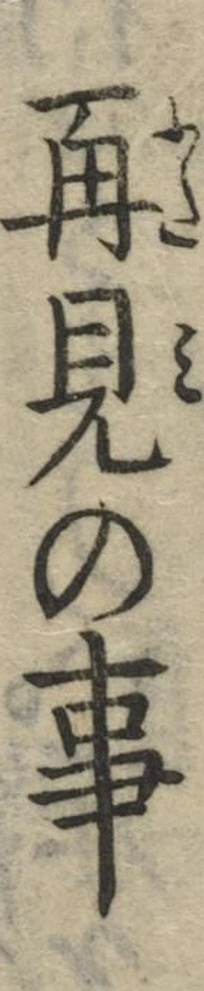再見の事
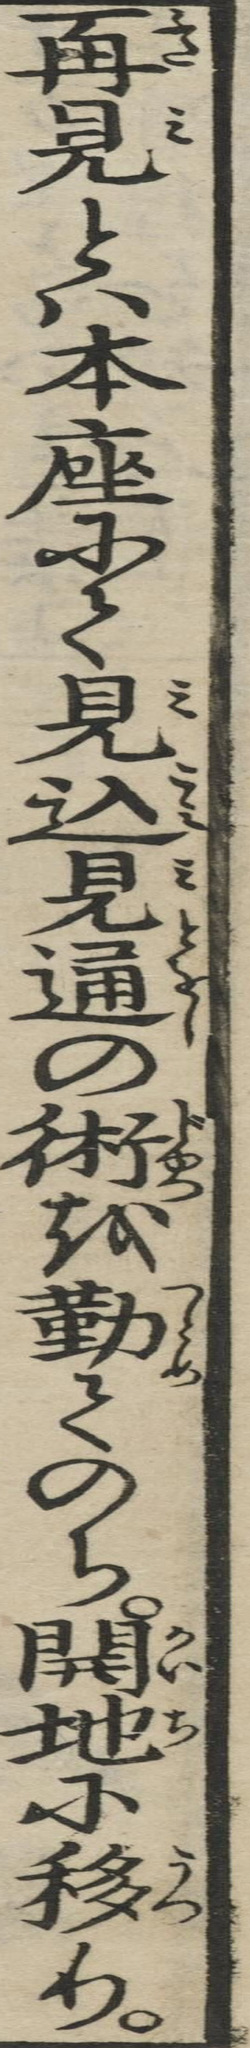再見とは本座にて見込見通の術を勤てのち開地に移り。
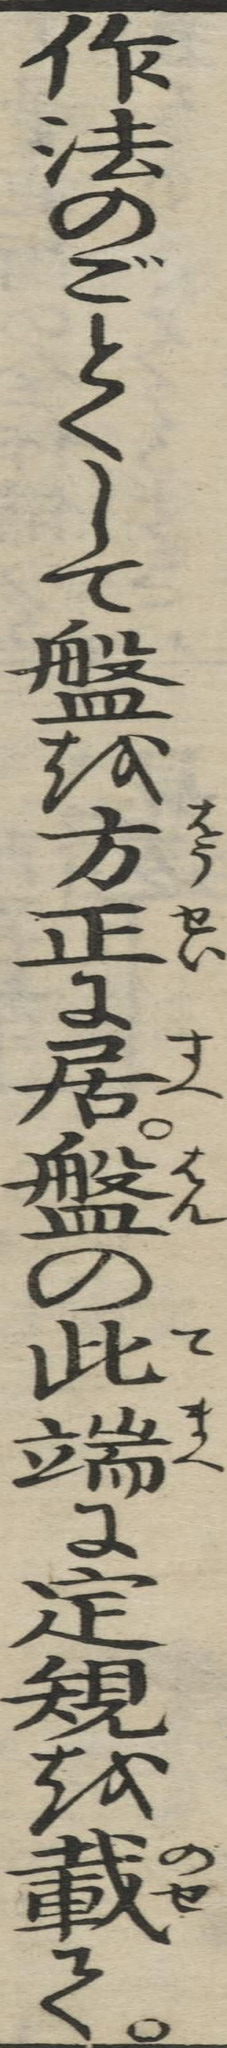作法のごとくして盤を方正に居。盤の此端に定規を載て。
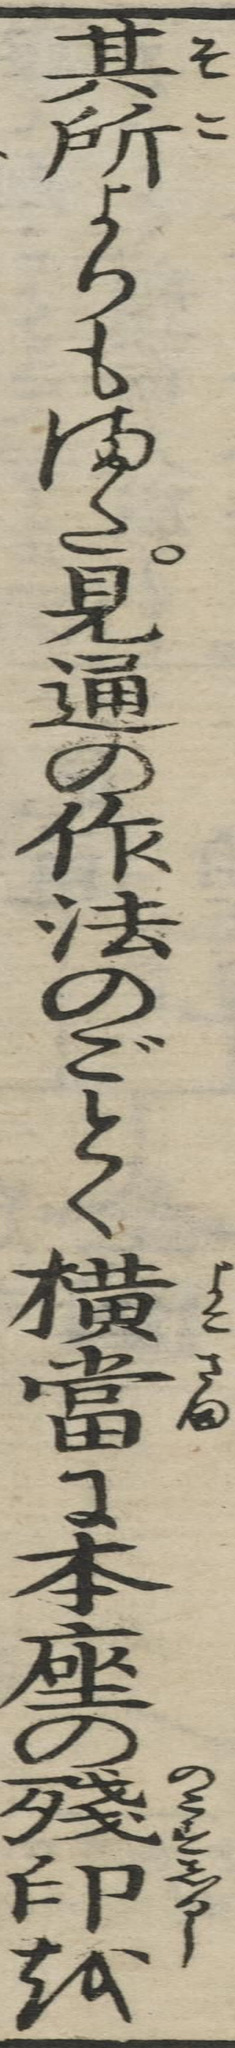其所よりもまた。身通の作法のごとく横当に本座の残印を
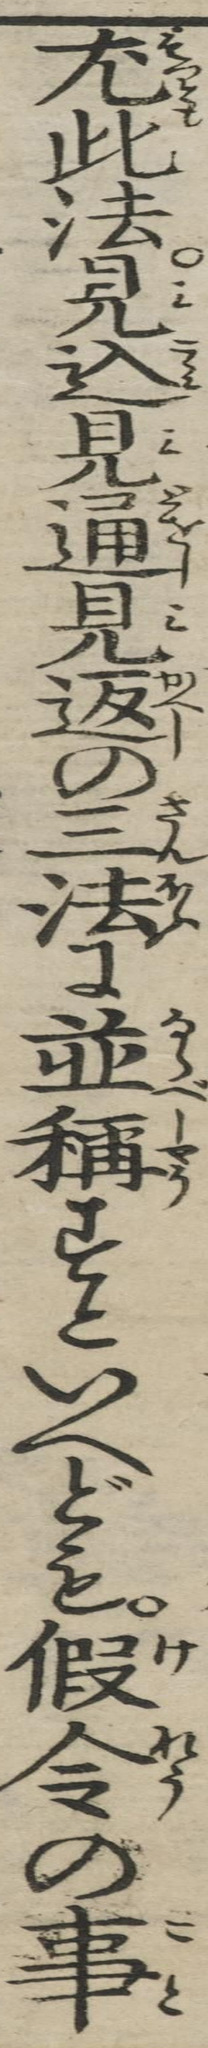尤此法。見込見通見返の三法に並称すといへども。仮令の事
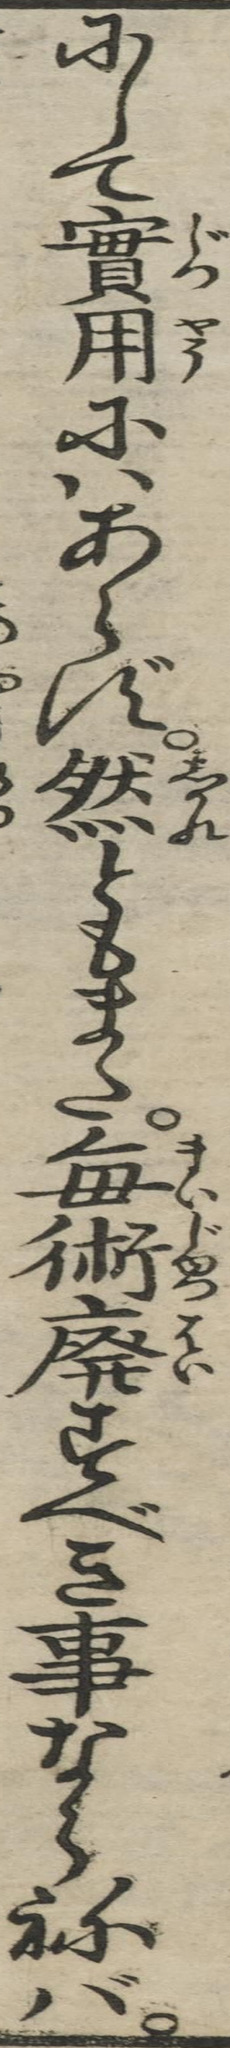にして実用にあらず。然ともまた。毎術廃すべき事ならねば。
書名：量地指南　巻之一（内題）
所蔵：東京大学地震研究所図書室 Earthquake Research Institute Library, The University of Tokyo, JAPAN
